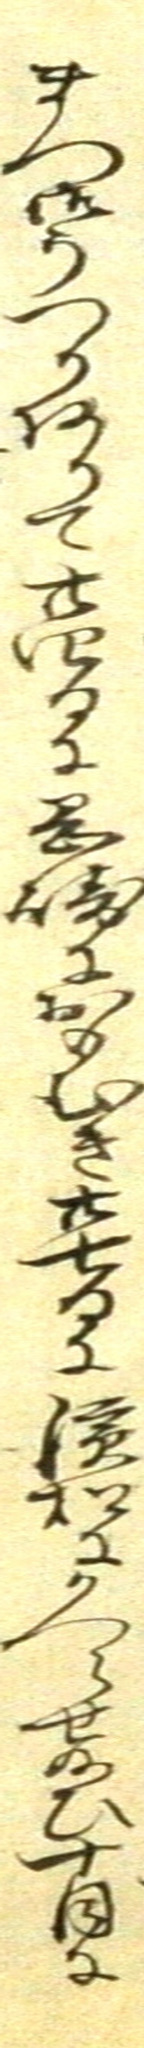まつ御うつりありて廿四日に岡崎におもむき廿七日に浜松にかへらせ給ひ十月に
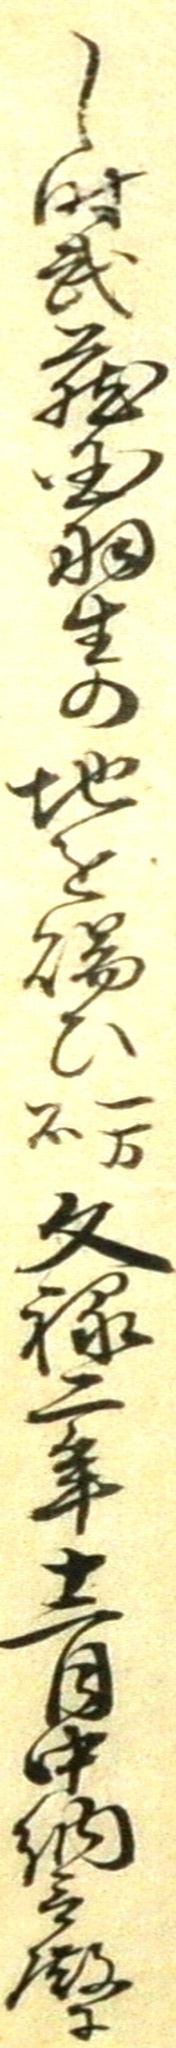し時武蔵国羽生の地を賜ひ一万石文禄二年十二月中納言殿に
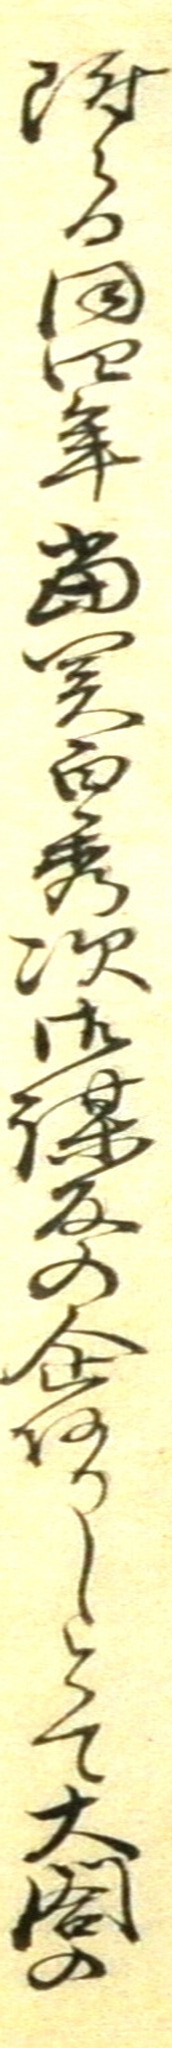附らる同四年当関白秀次御謀反の企ありしとて太閤の
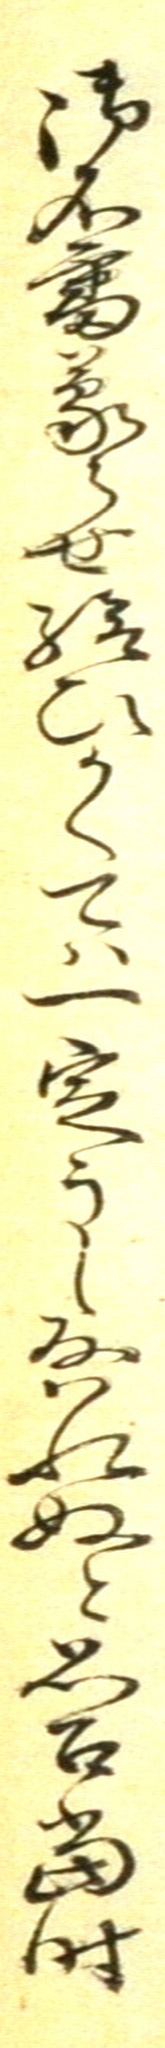御不審蒙らせ給ひかくては一定うしなはれぬと思召当時
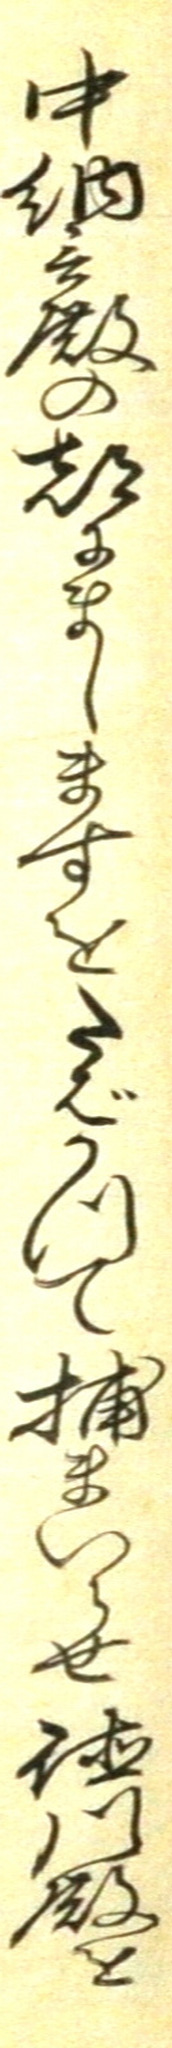中納言殿の都にましますをたばかつて捕まいらせ徳川殿を
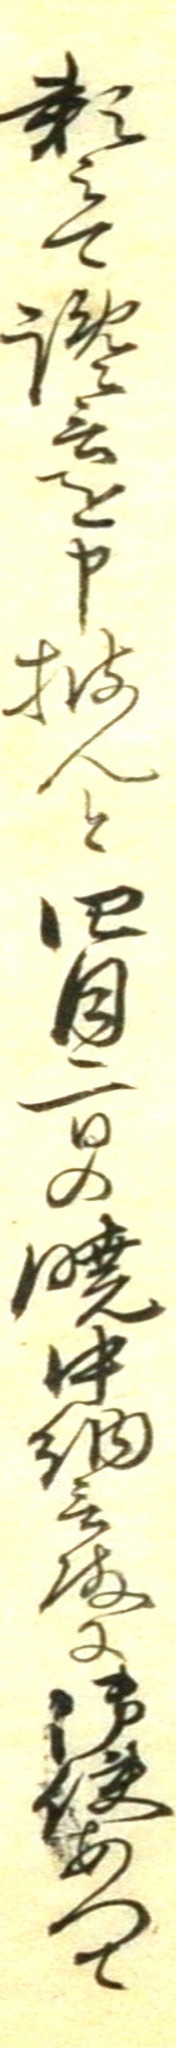頼みて讒言を申披んと四月二日の暁中納言殿に御使あつて
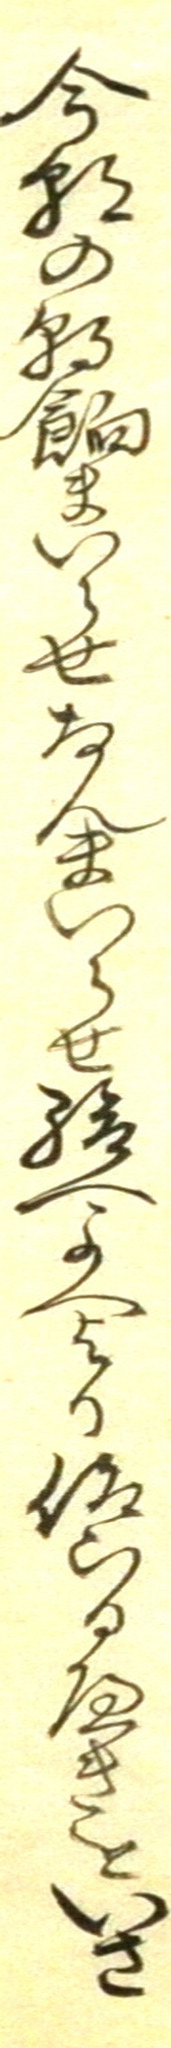今朝の朝餉まいらせなんまいらせ給へよへより仰らるへきをいさ
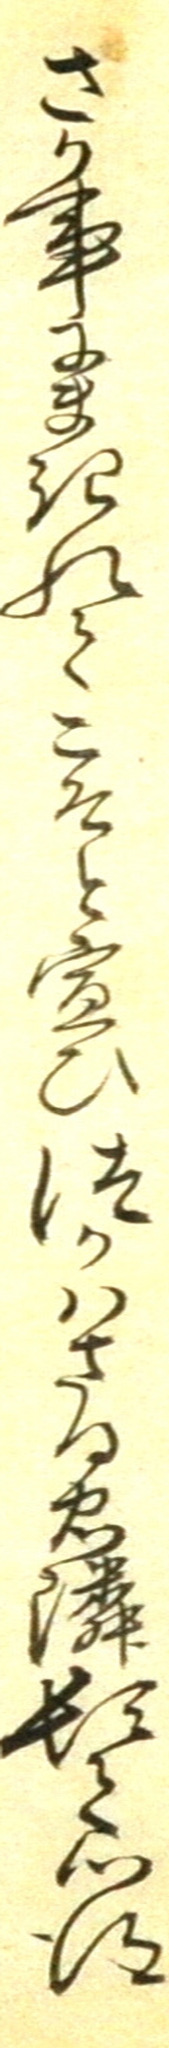さか事にまきれてこそと宣ひつかはさる忠隣頓て心得
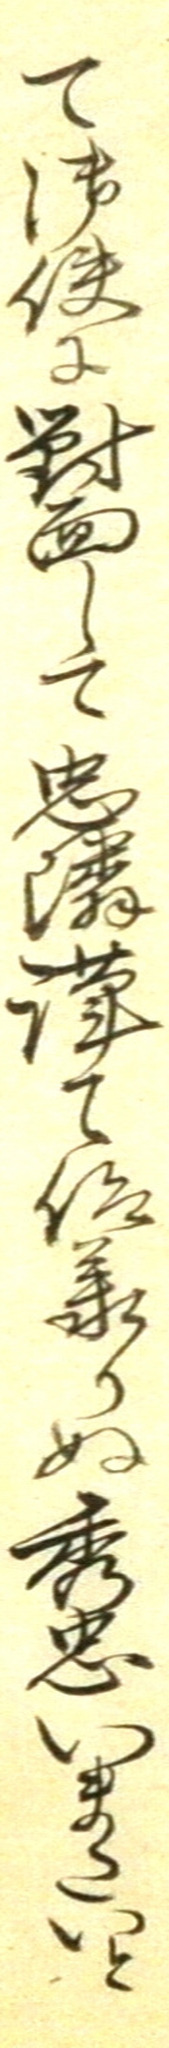て御使に対面して忠隣謹て仰蒙りぬ秀忠いまたいと
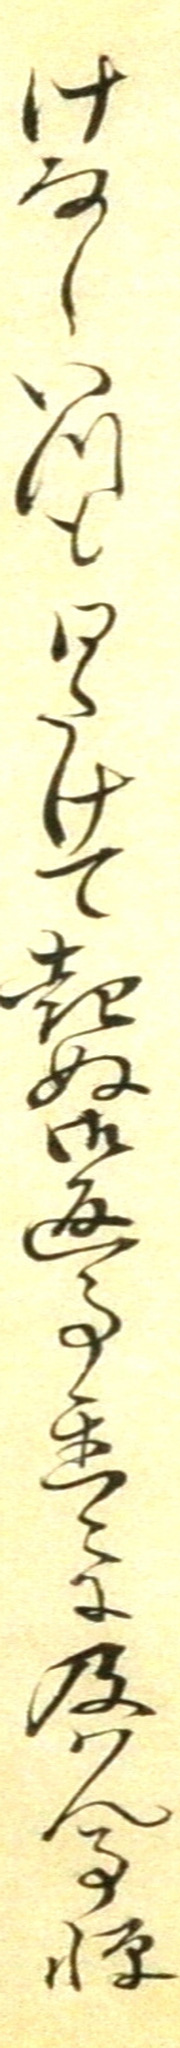けなしいつも日たけて起ぬ御返事遅々に及はん事憚
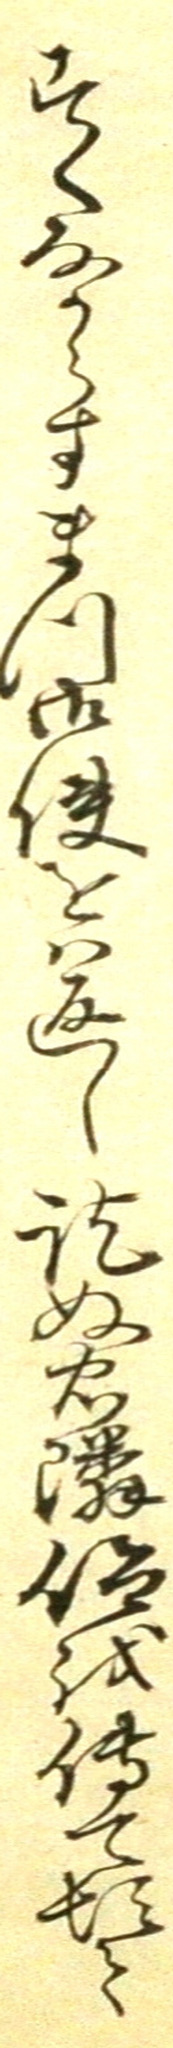すくなからすまつ御使をは返し訖ぬ忠隣仰を伝て頓て
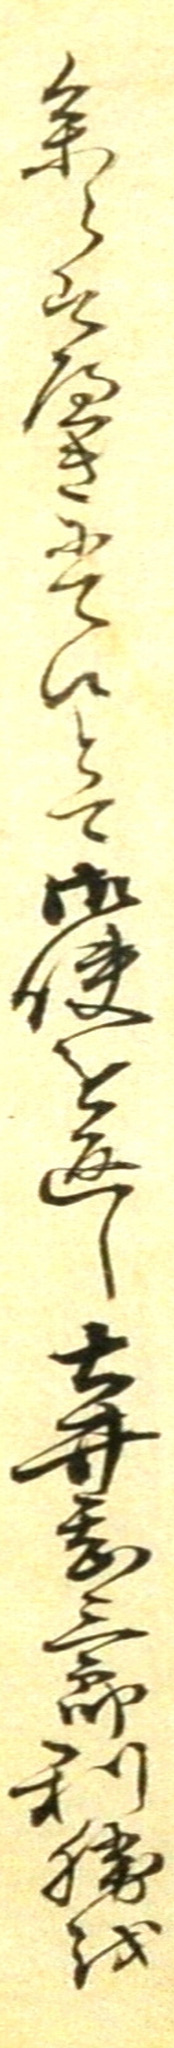参らすへきにて候とて御使を返し土井甚三郎利勝を
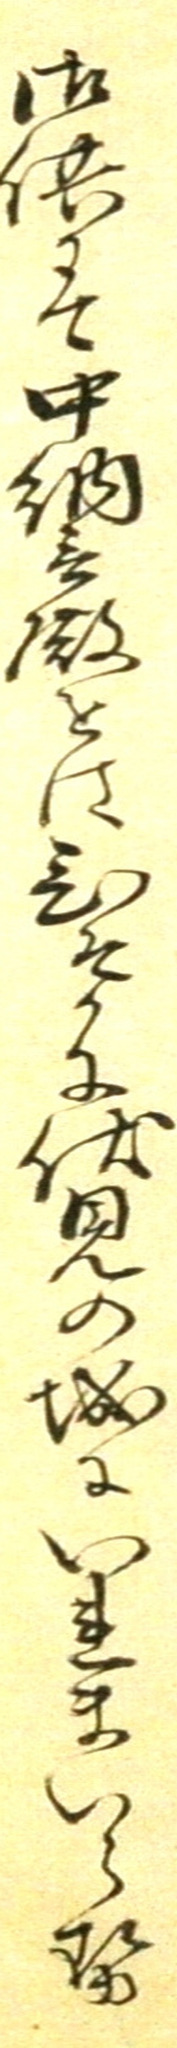御供にて中納言殿をはひそかに伏見の城にいれまいらせ

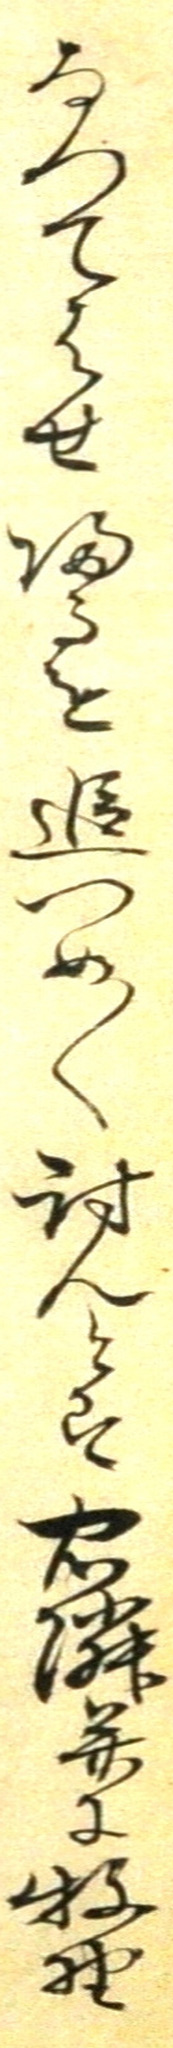なつてはせ帰ると追つめ〳〵討んとす忠隣幷に牧野
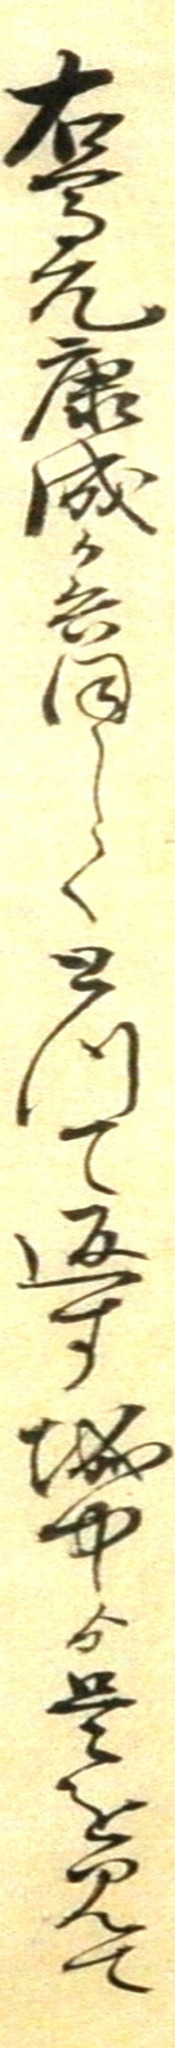右馬允康成か兵同しくとつて返す城中ゟ是を見て
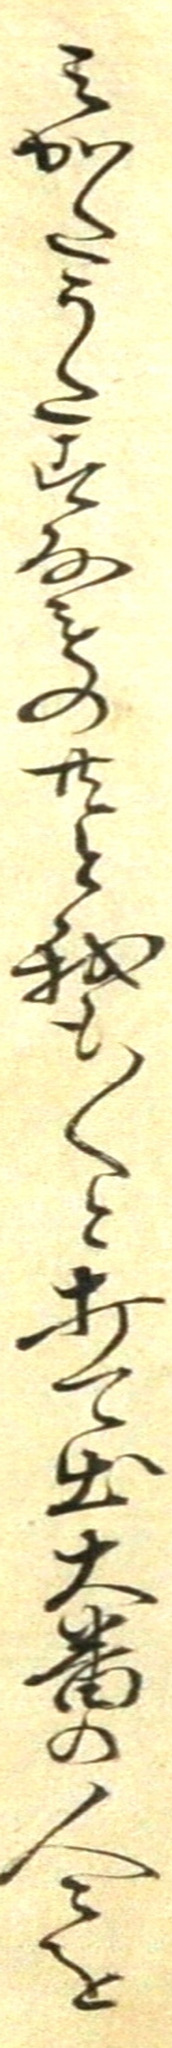みかたうたすなもの共と我も〳〵と打て出大番の人々を
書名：藩翰譜（四・中）
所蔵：伊那市立高遠町図書館・合同会社AMANE
